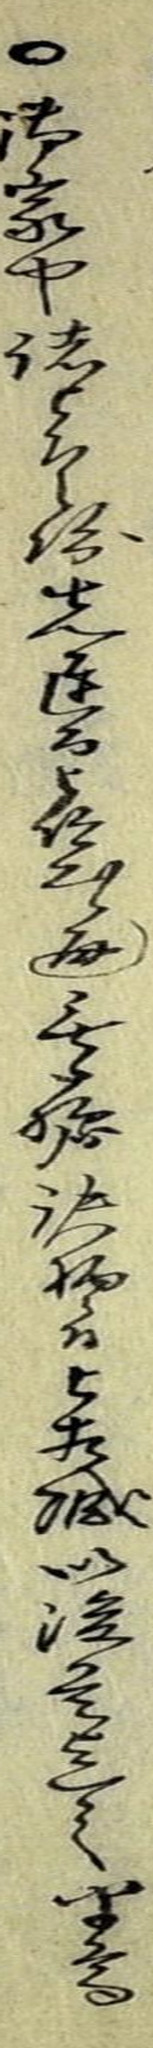○御家中諸被下之儀先達而被仰出候通無御拠訳柄に付被相減以後是迄之半高
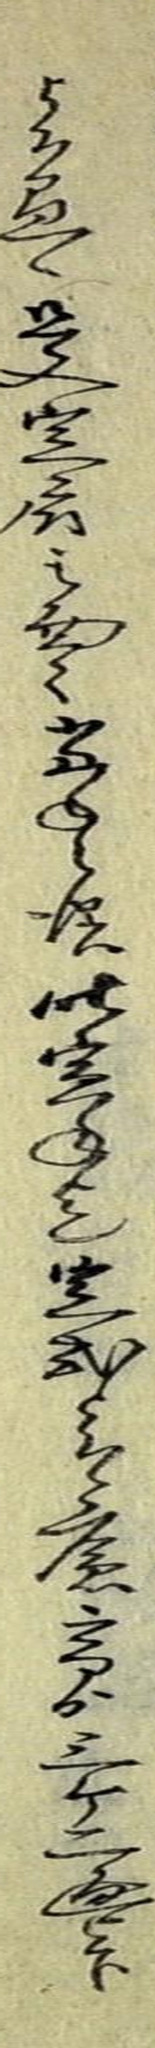被下置候且定府之面々当年之儀は昨寅年迄定式被下候廉高ゟ三ヶ二通被下
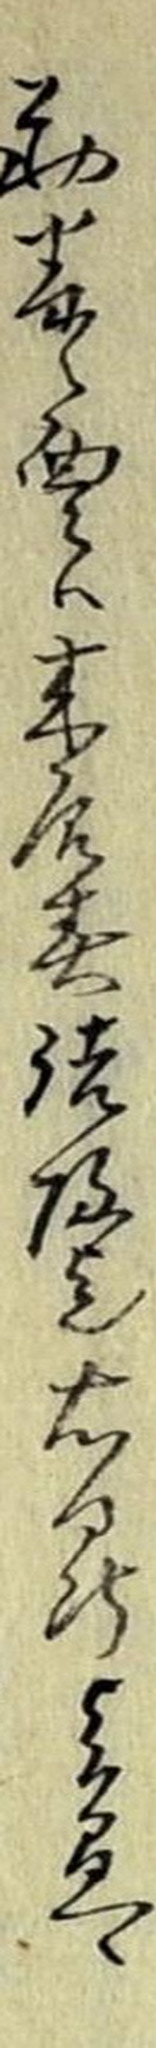勤番之面々は來辰春詰帰迄右同断被下置候
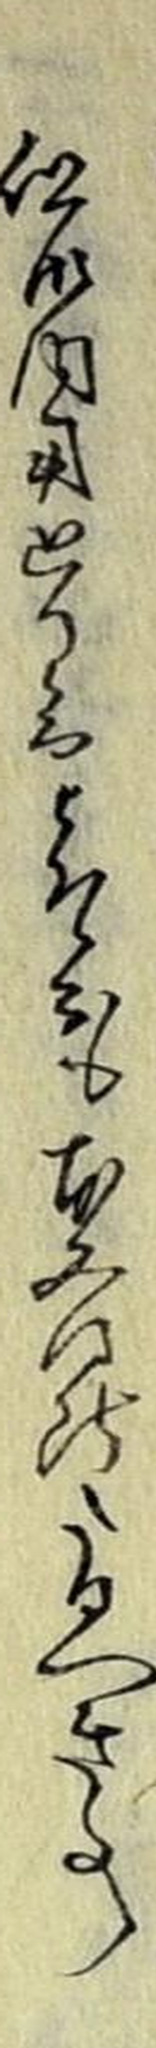但御内用廻りに而被下候分も本文同断たるへき事
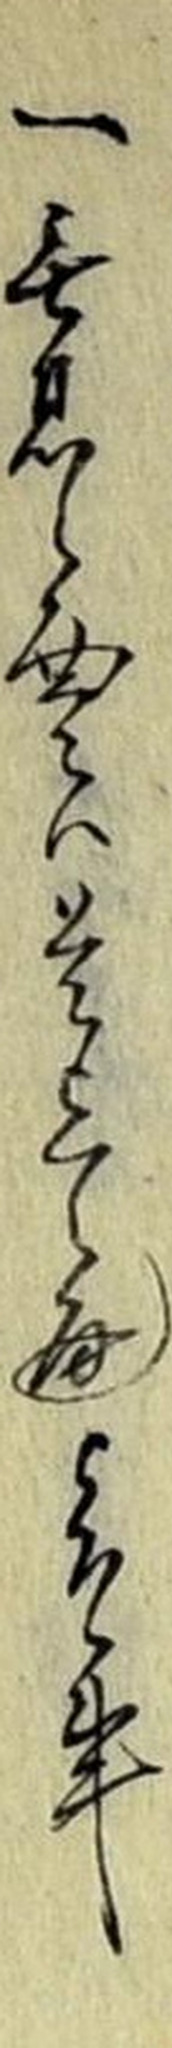一無息之面々は是迄之通被下候事
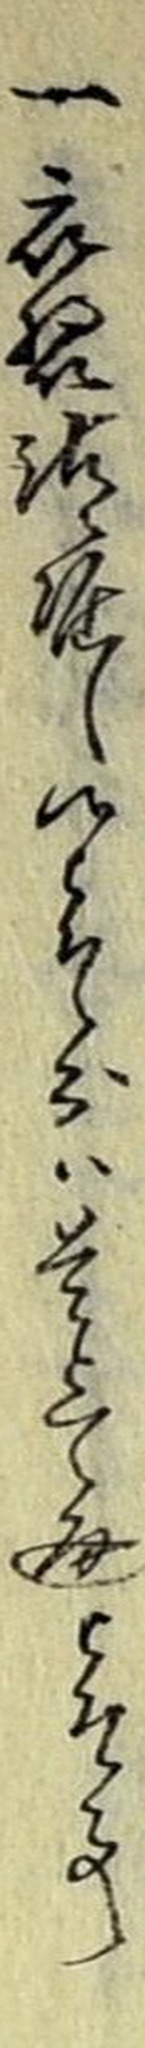一衣装銀に准し候被下候分は是迄之通被下候事
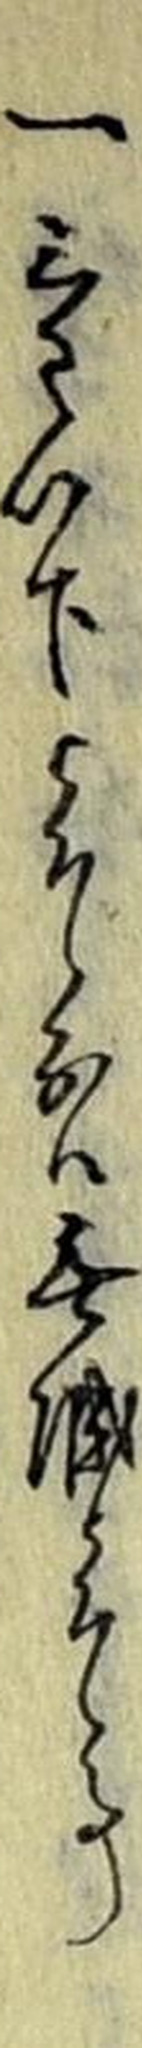一三匁以可被下候分は無減被下候事
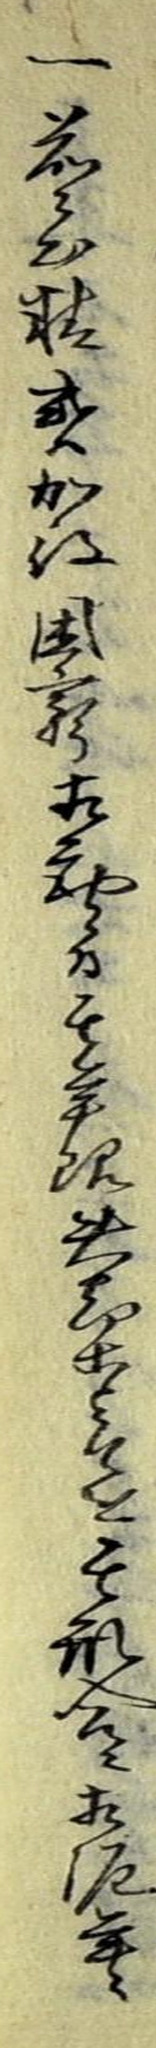一前々出精或は加役困窮相勤に付其年限失却等迄を其形合に相泥年々

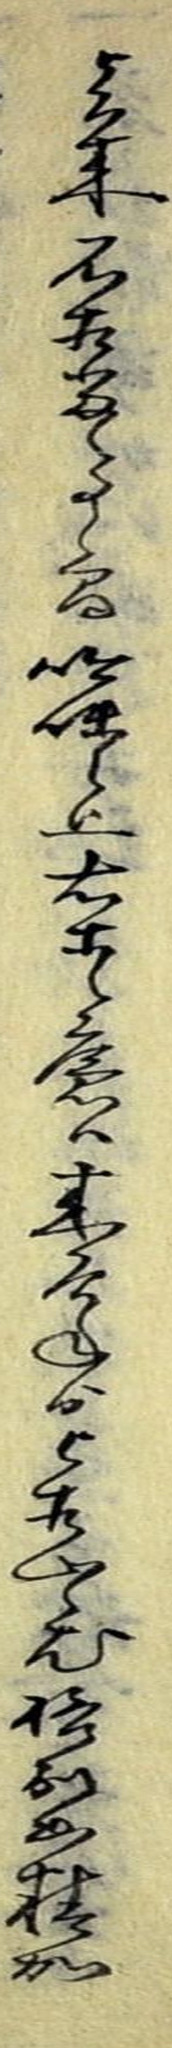被下来不相当之事候間吟味之上右等之廉は来辰年ゟ被相止候尤格別出精加
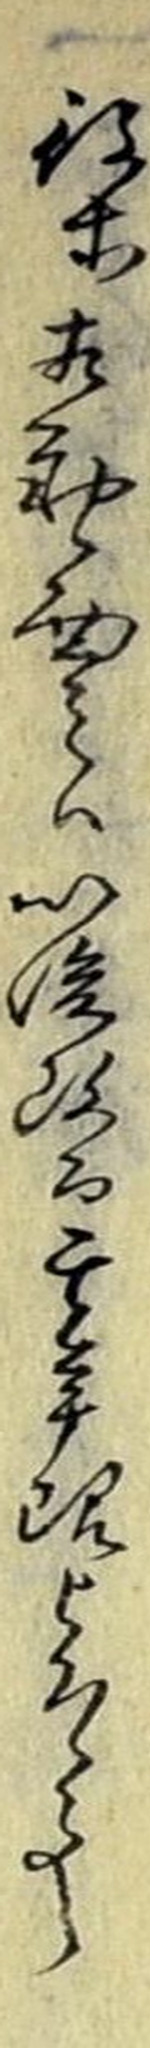役等相勤候面々は以後改而其年限被下候事
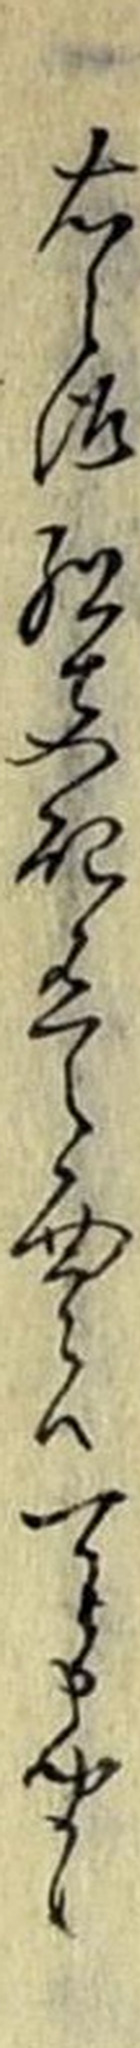右之趣組支配有之面々は可被申聞候
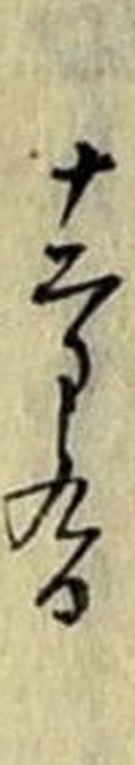十二月九日
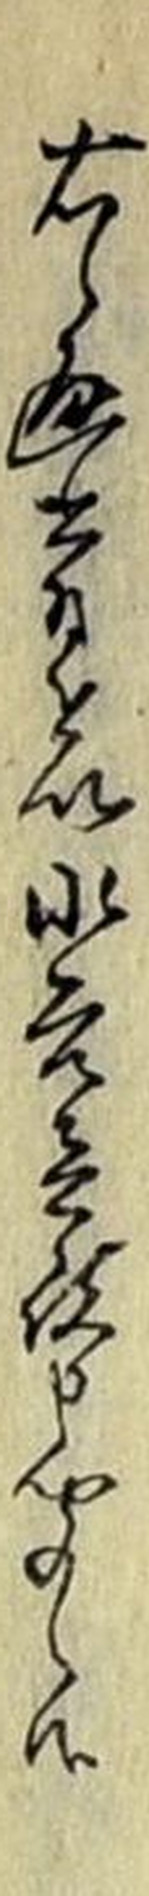右之通書付を以水谷壱岐申聞之候
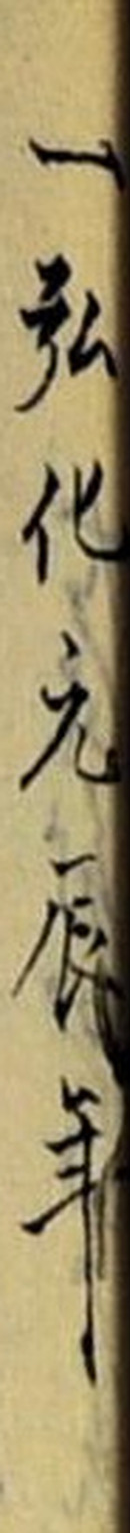一弘化元辰年
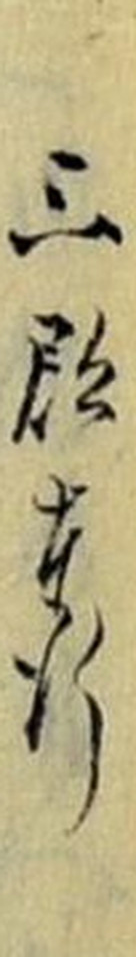三郡奉行
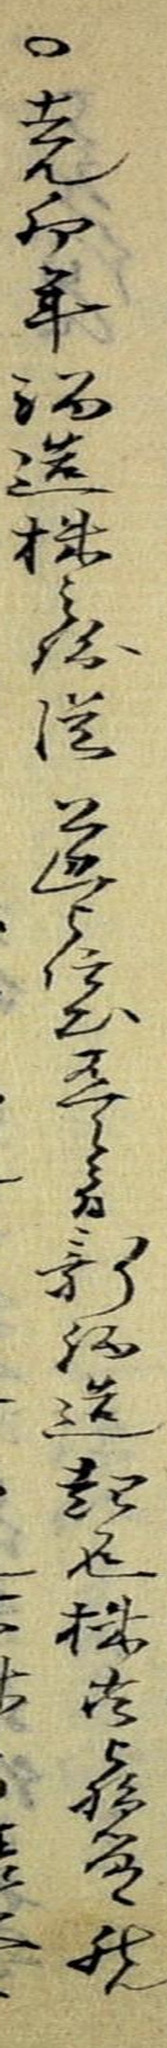○去ル卯年酒造株之儀従公辺被仰出有之に付新酒造起返株共被指留候然ル
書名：命令之部 六
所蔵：福井県文書館 Fukui Prefectural Archives
